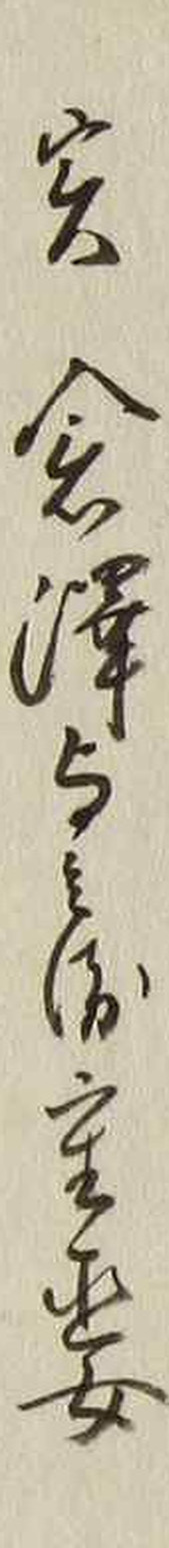実会沢与兵衛重直女
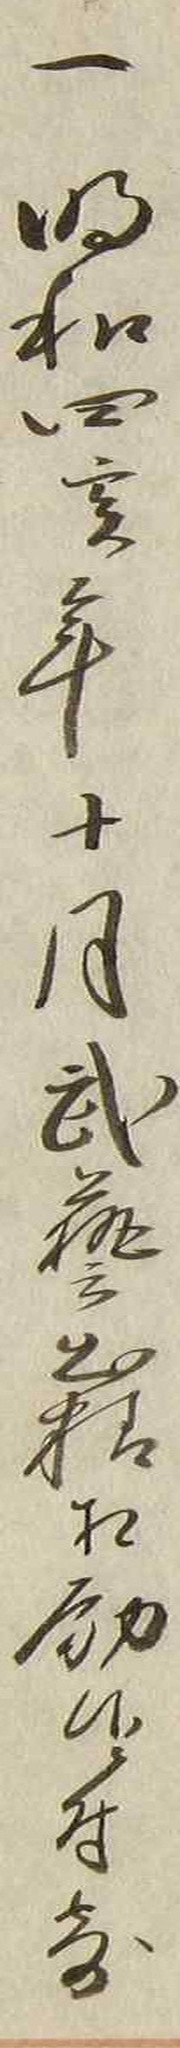一明和四亥年十月武芸出精相励候ニ付奇
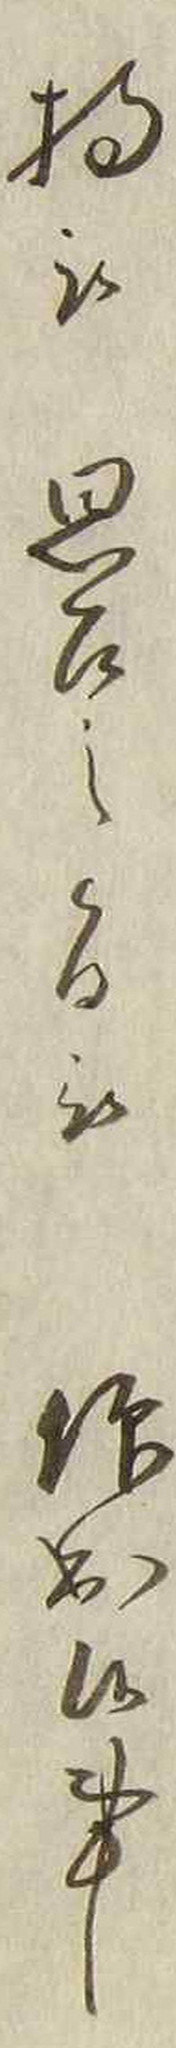特被思召之旨被仰出候事

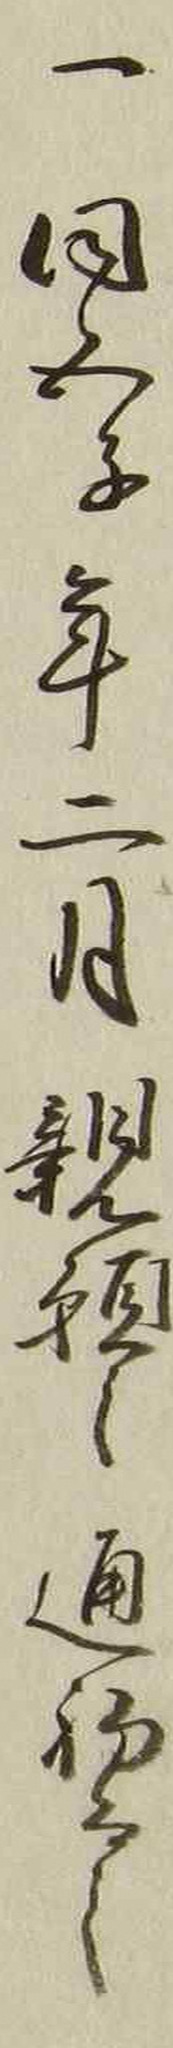一同五子年二月親願之通初而之
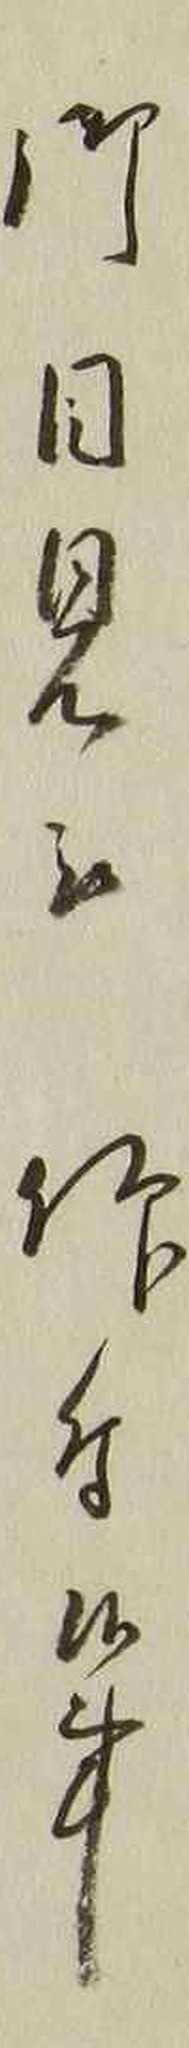御目見被仰付候事
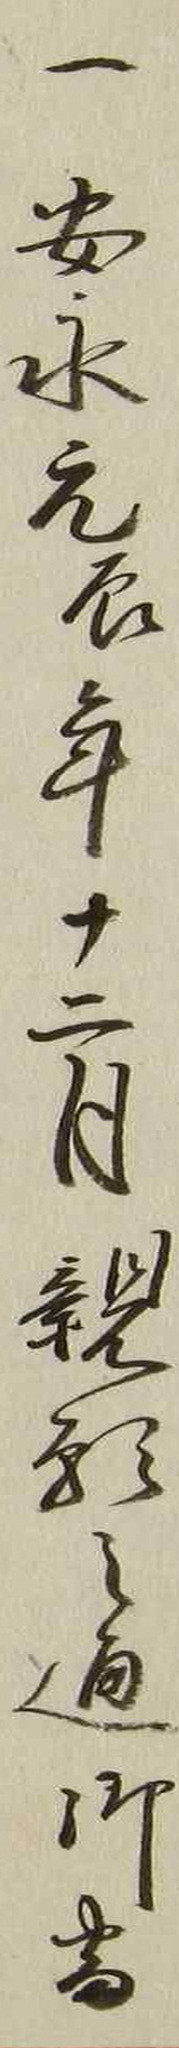一安永元辰年十二月親願之通御番
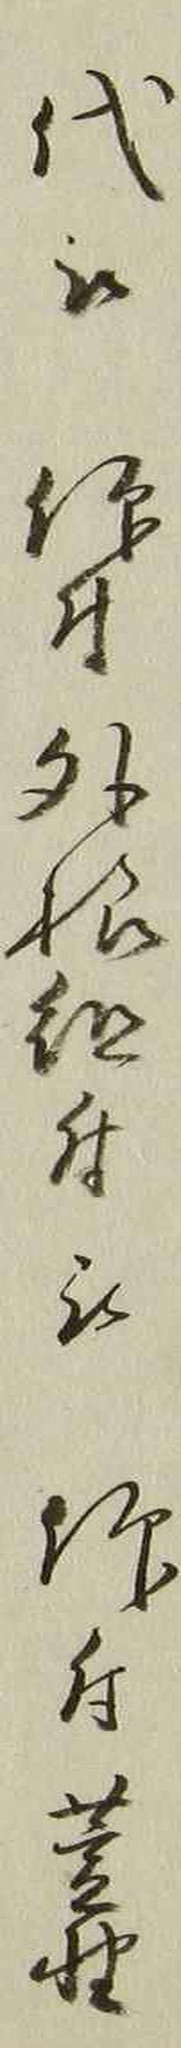代被仰付外様組付被仰付菅野
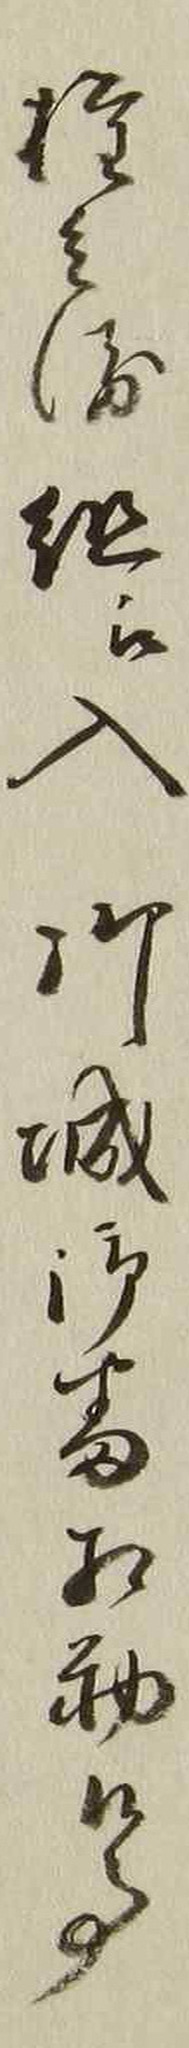権兵衛組江入御城御番相勤候事
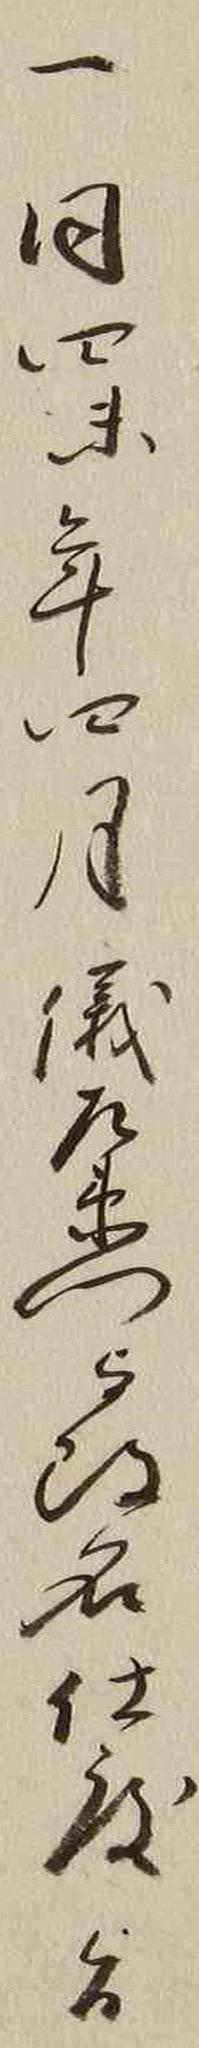一同四未年四月儀左衛門与改名仕度旨
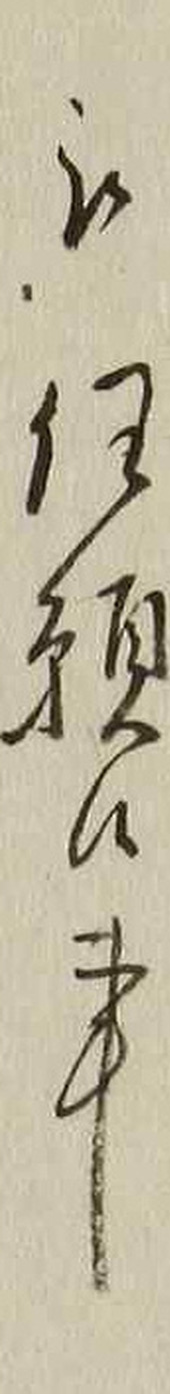被任願候事
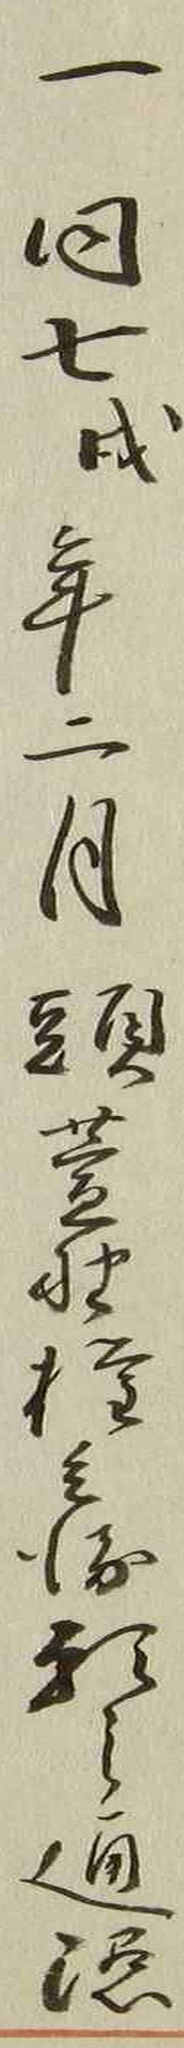一同七戌年二月頭菅野権兵衛願之通隠
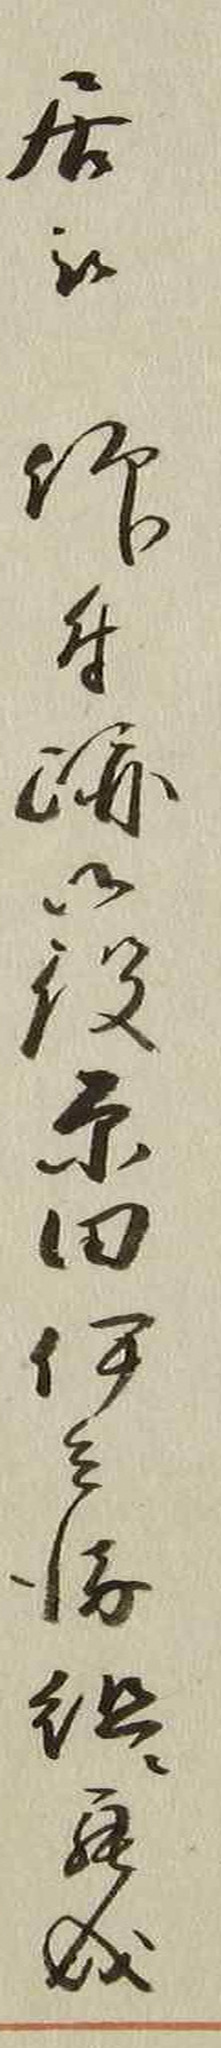居被仰付跡御役原田伊兵衛組ニ罷成
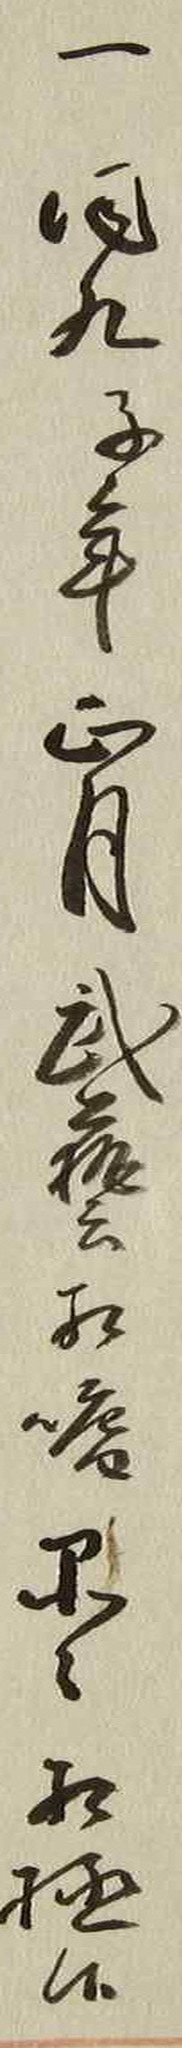一同九子年正月武芸相嗜品々相極候
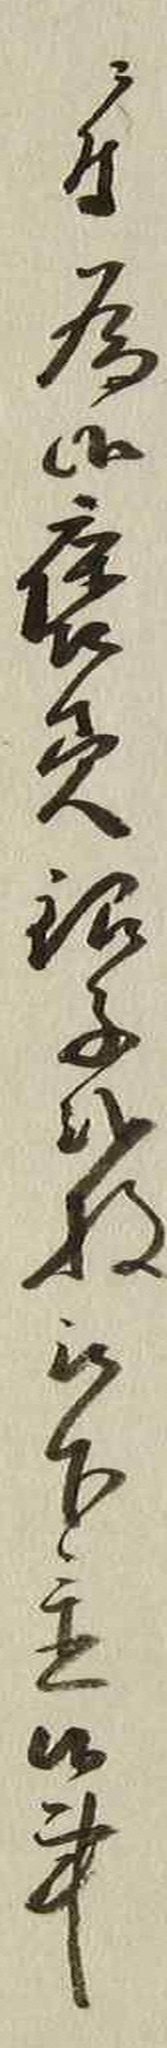ニ付為御褒美銀子弐枚被下置候事
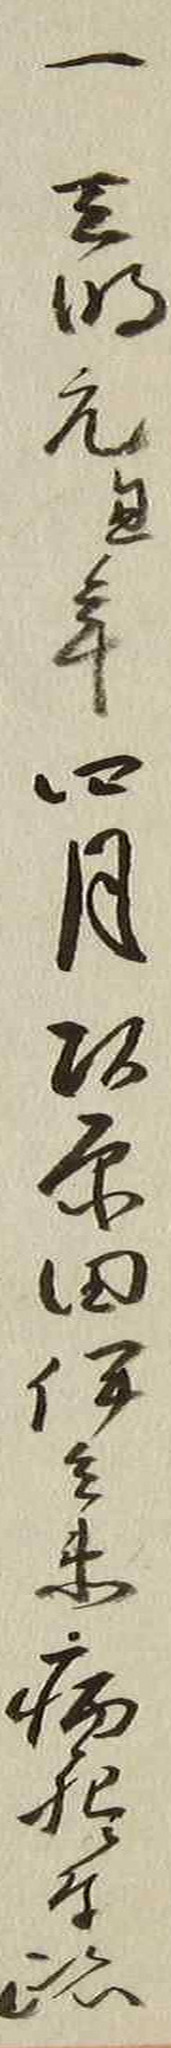一天明元丑年四月頭原田伊兵衛病気ニ付跡
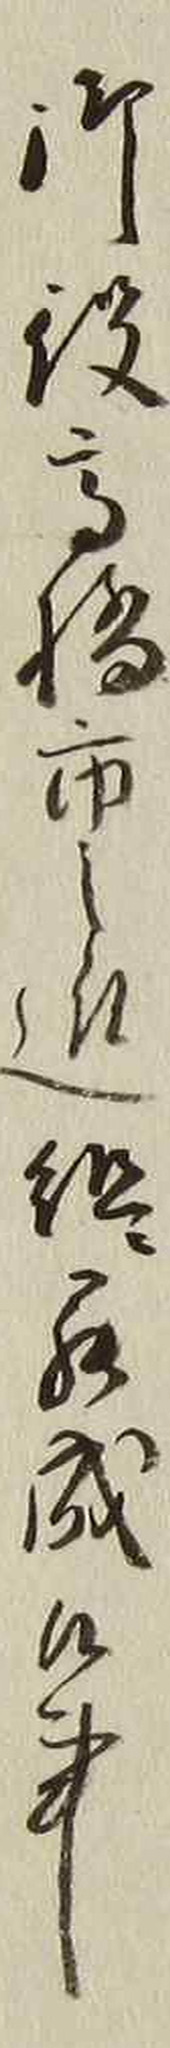御役高橋市之進組ニ罷成候事
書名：諸士系譜　巻之122　よ之部5
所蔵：会津若松市立会津図書館
